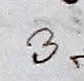3
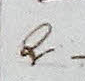2
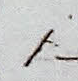1
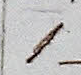1
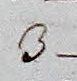3
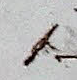1
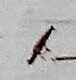1
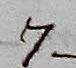7
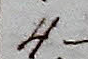4
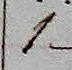1
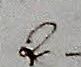2
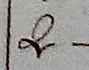2
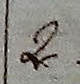2
